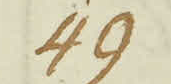49
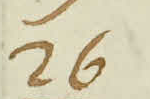26
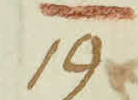19
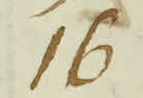16
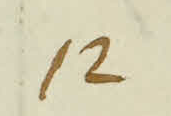12
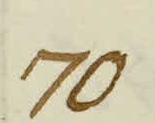70
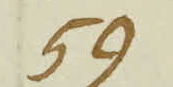59
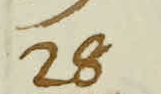28
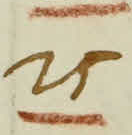25
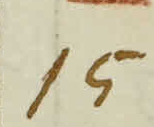15
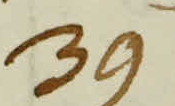39
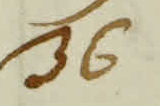36
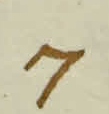7
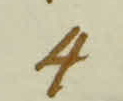4
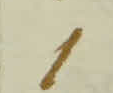1
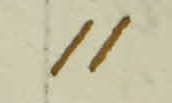11
